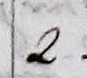2
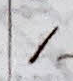1
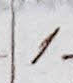1
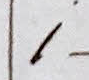1
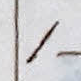1
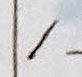1
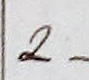2
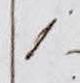1
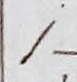1
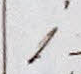1
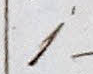1
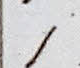1
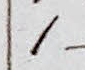1
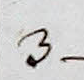3
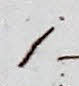1
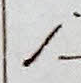1
